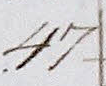47
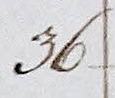36
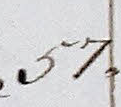57
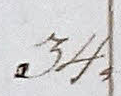34
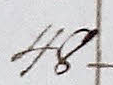48
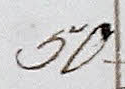50
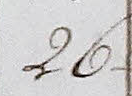26
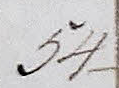54
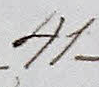41
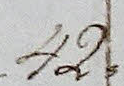42
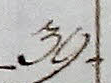39
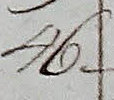46
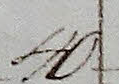40
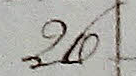26
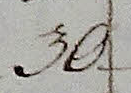30
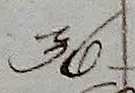36
